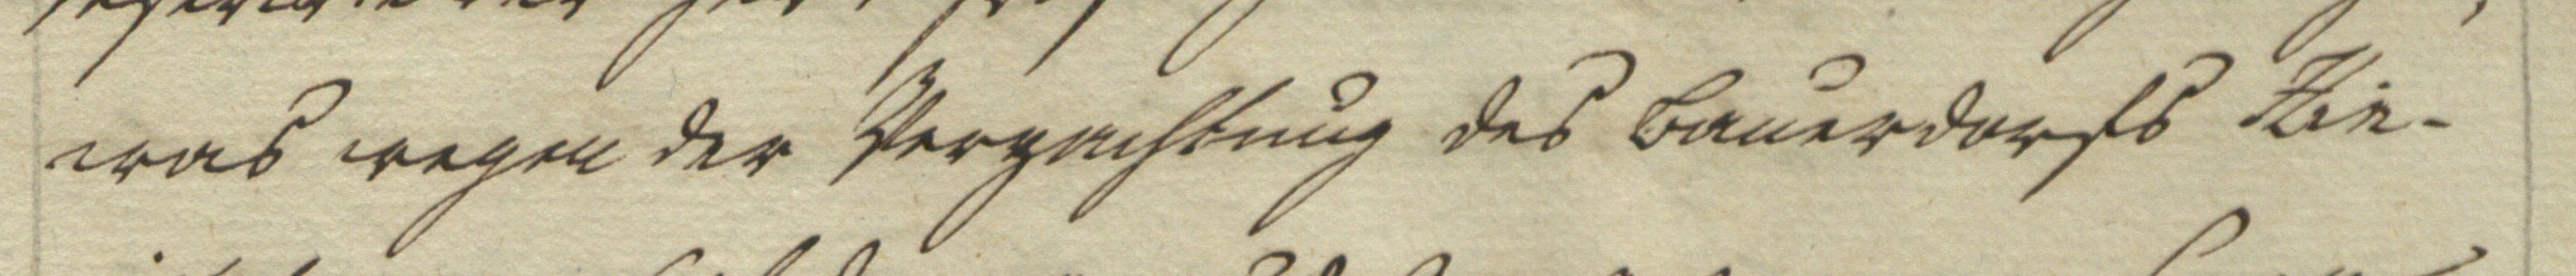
was wegen der Verpachtung des Bauerdorfs Hin¬
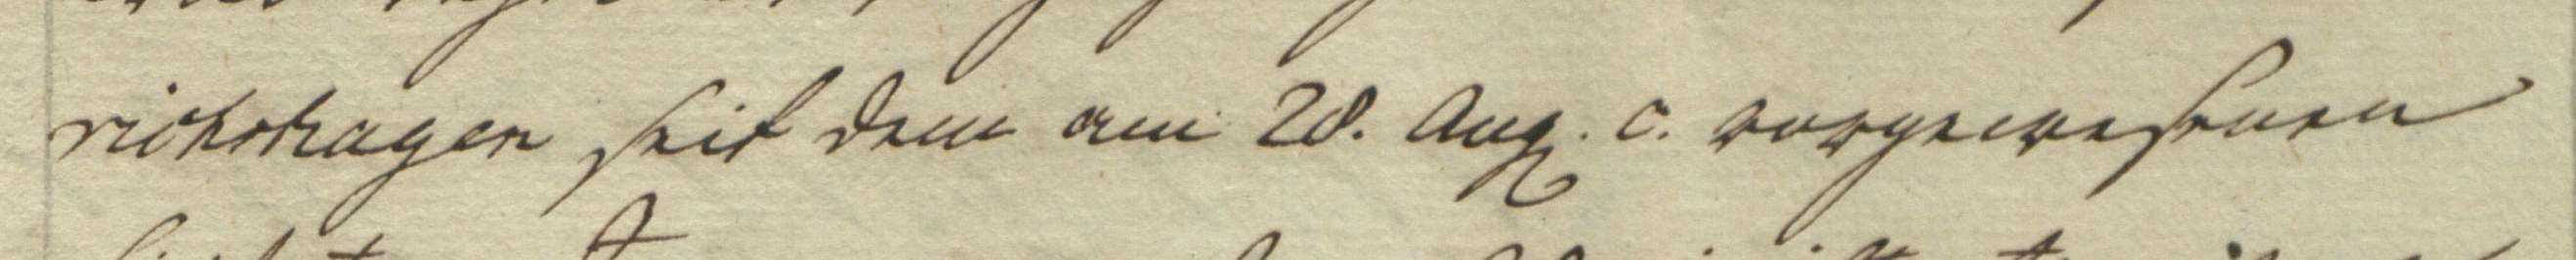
richshagen seit dem am 28. Aug. c. vorgewesenen
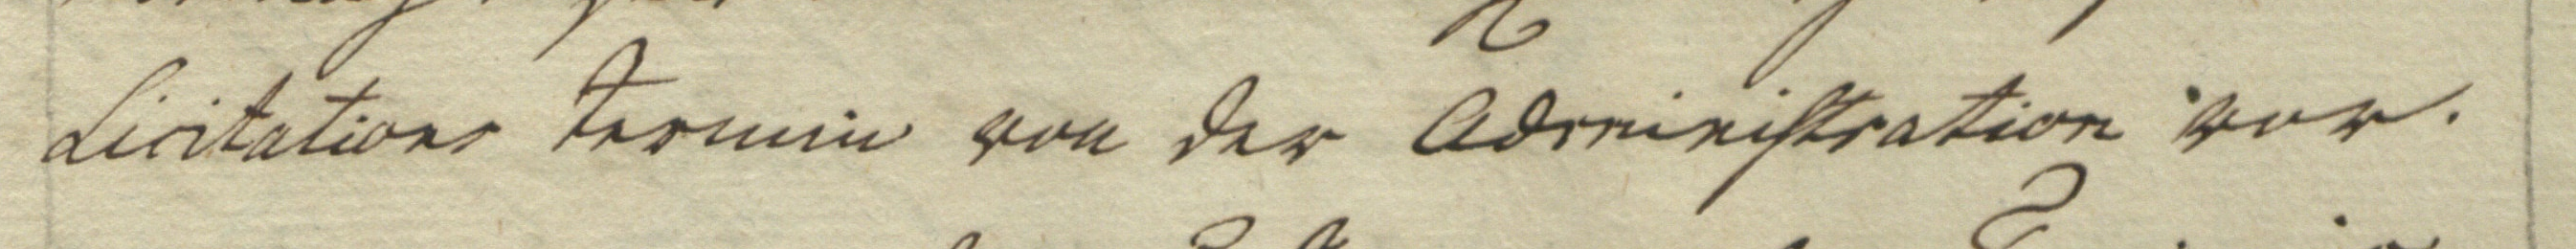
Licitations Termin von der Administration vor¬
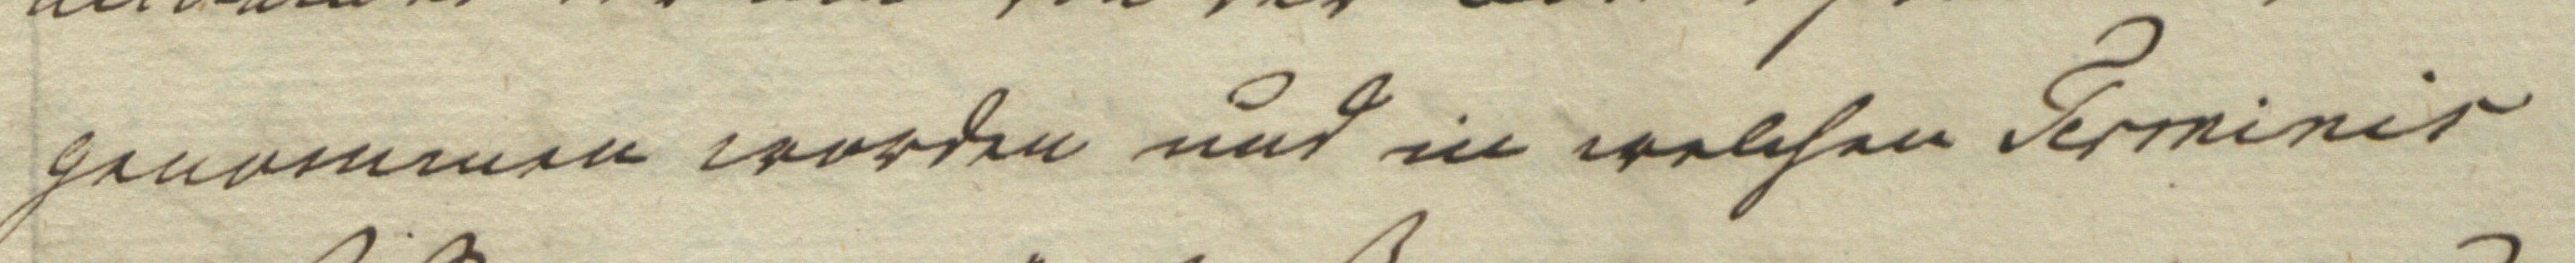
genommen worden und in welchen Terminis
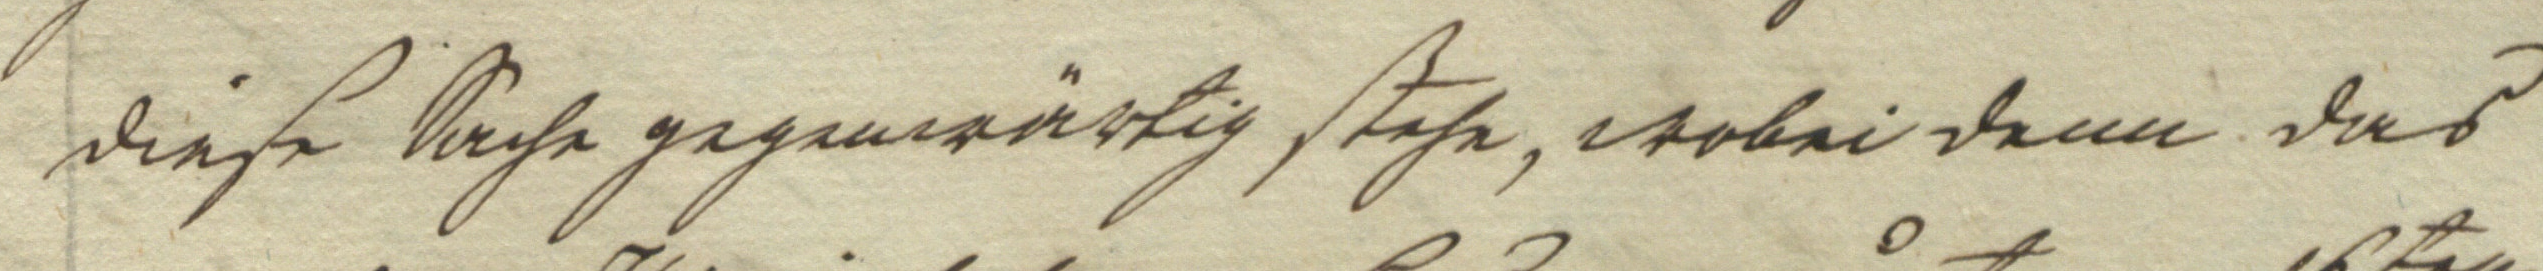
diese Sache gegenwärtig stehe, wobei denn das
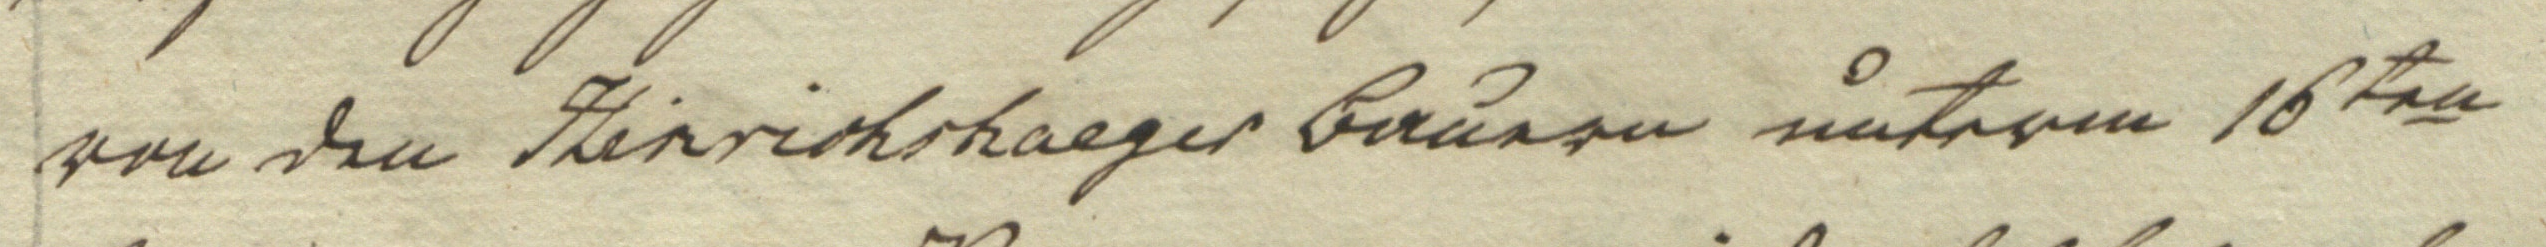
von den Henrichshaeger Bauern unterm 16 ten
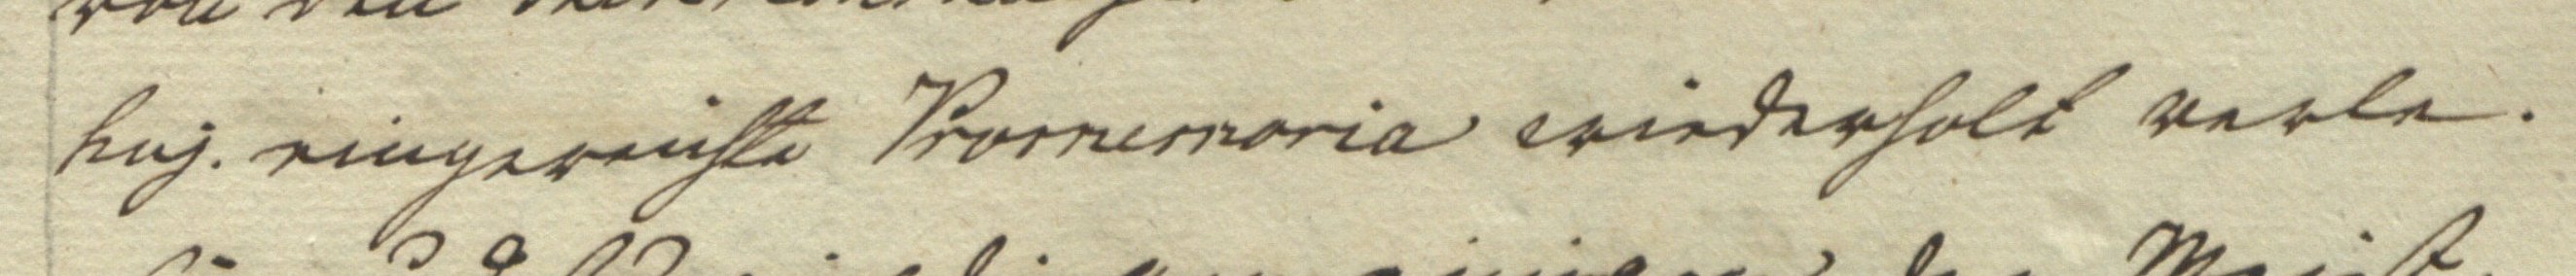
huj. eingereichte Promemoria wiederholt verle¬
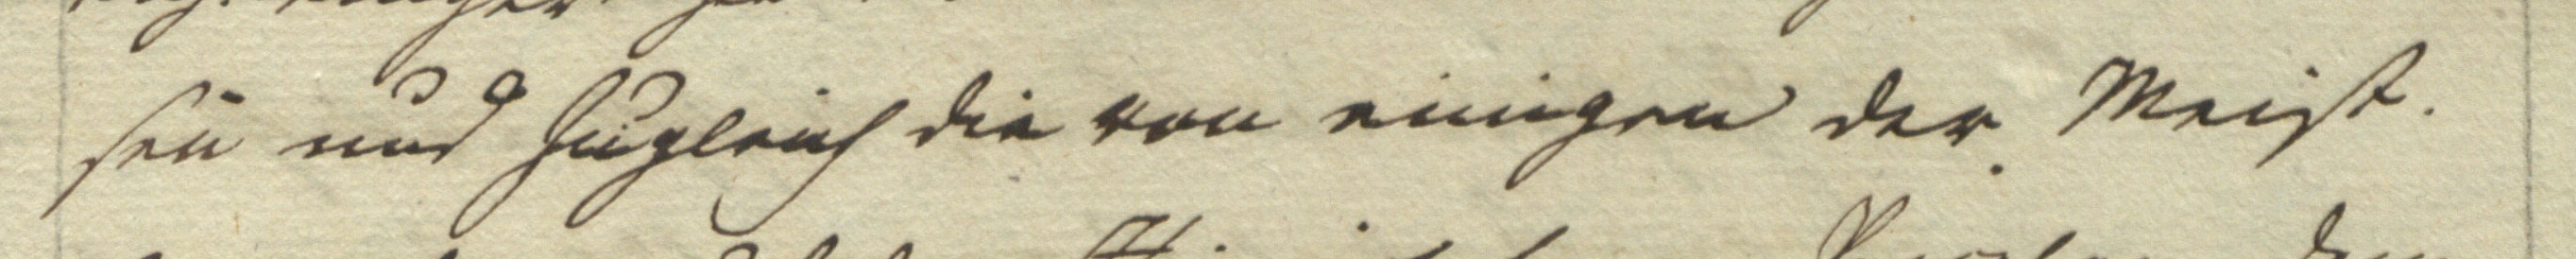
sen und zugleich die von einigen der Meist¬
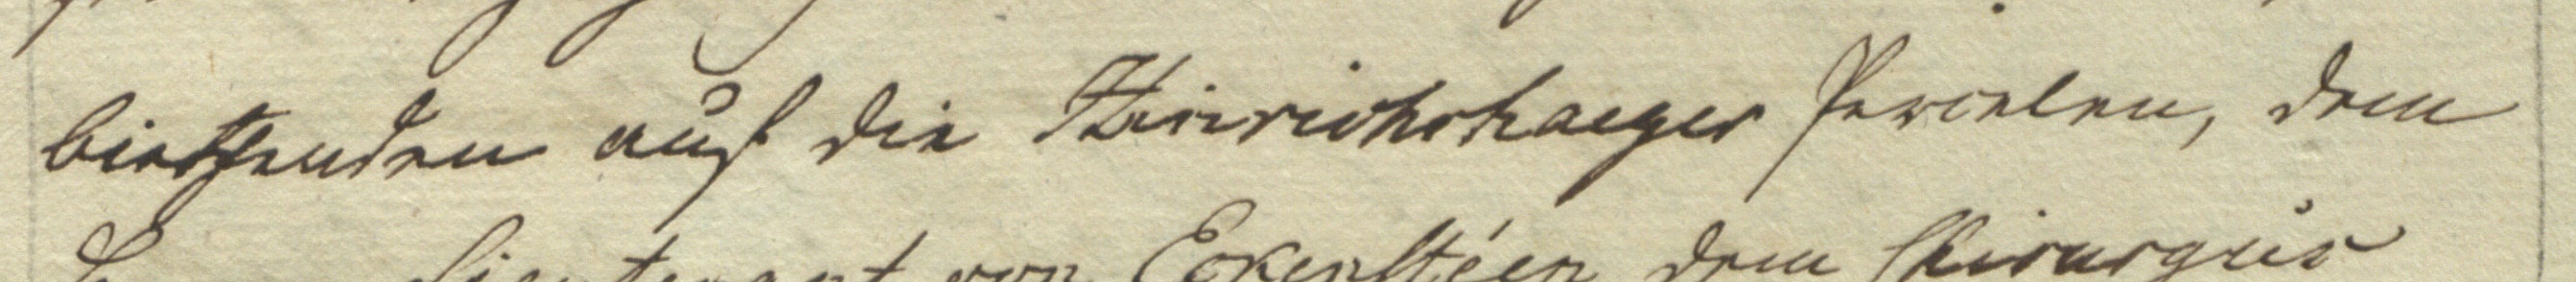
biethenden auf die Hinrichshaeger Percelen, dem
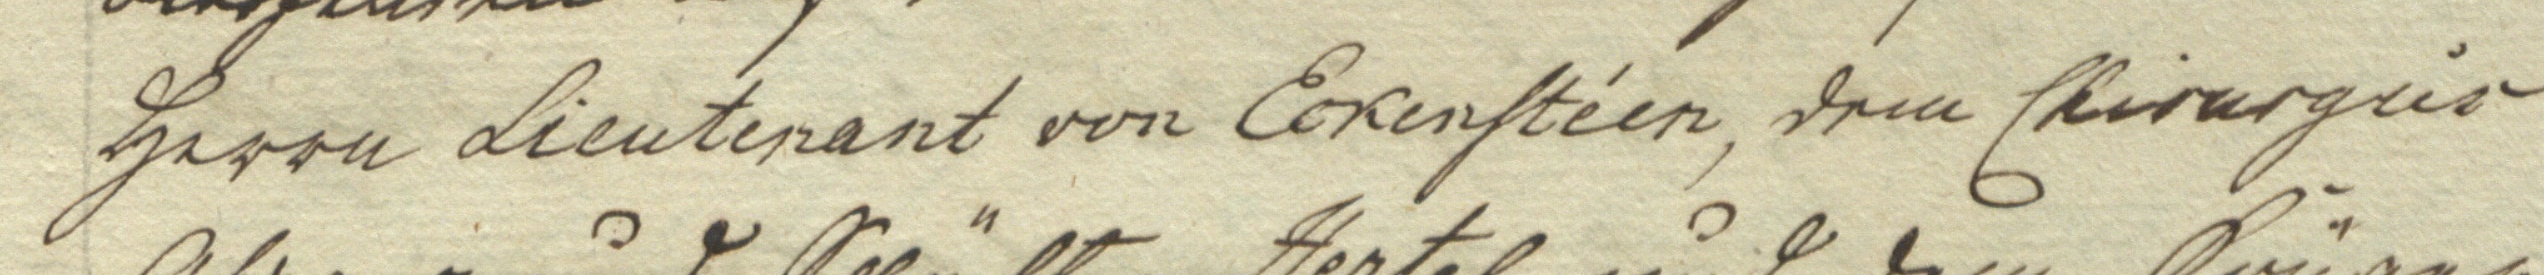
Herrn Lieutenant von Eckenstéen dem Chirurgus
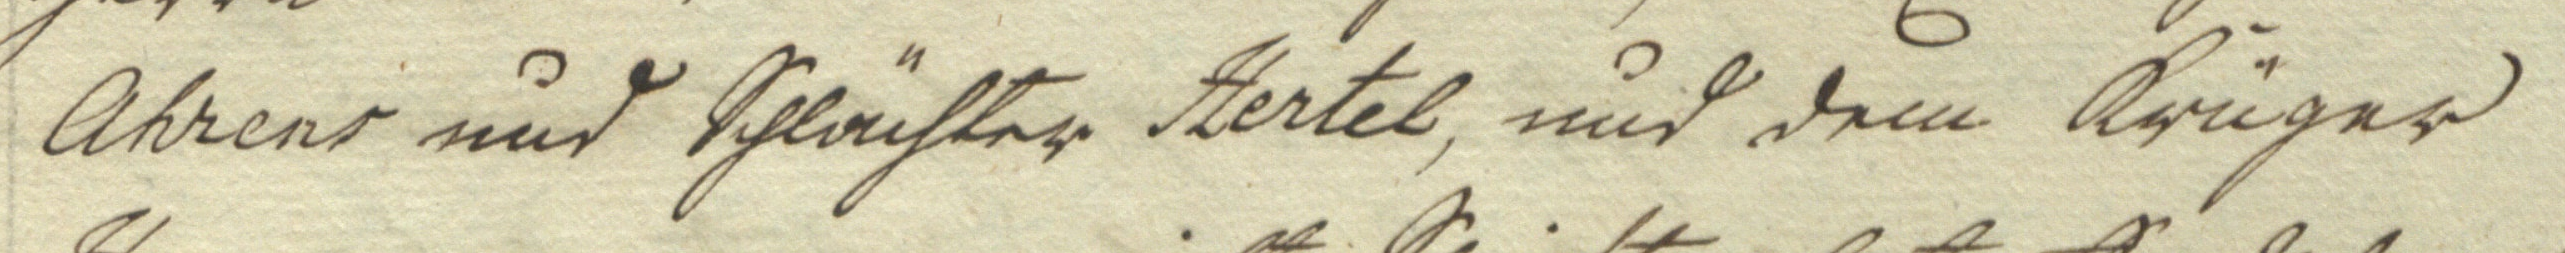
Ahrens und Schlächter Hertel, und dem Krüger
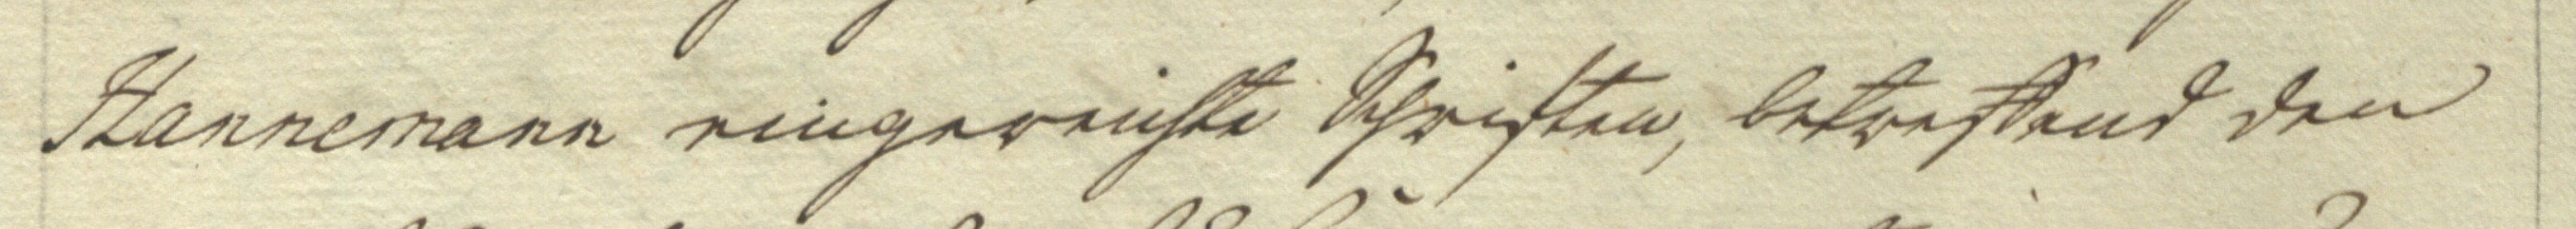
Hannemann eingereichte Schriften, betreffend den
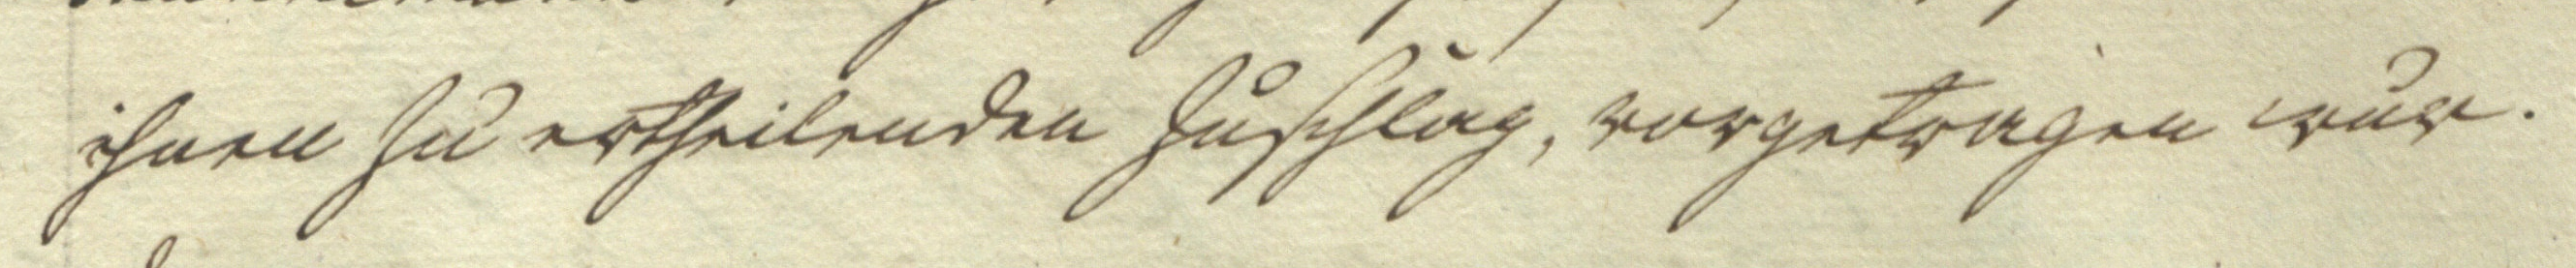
ihnen zu ertheilenden Zuschlag, vorgetragen wur¬
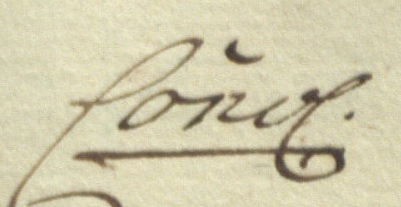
Concl.
